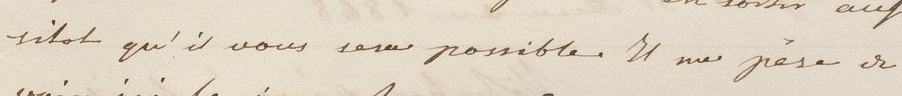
sitot qu'il vous sera possible. Il me pèse de
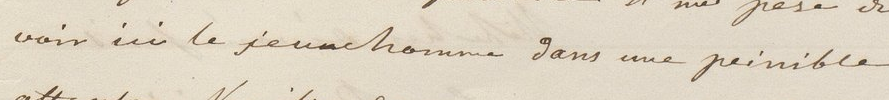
voir ici le jeune homme dans une peinible
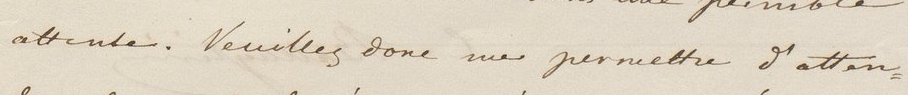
attente. Veuillez donc me permettre d'atten-
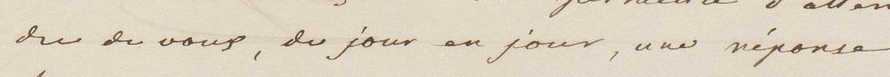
dre de vous, du jour en jour, une réponse
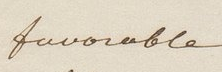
favorable.
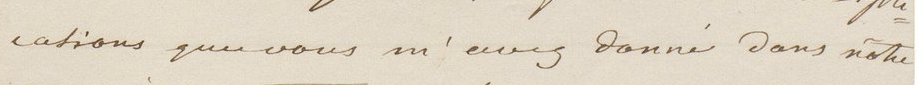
cations que vous m'avez donné dans notre
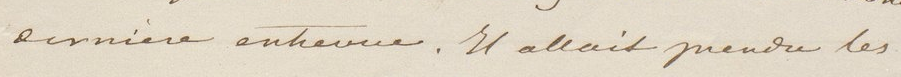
dernière entrevue. Il allait prendre les
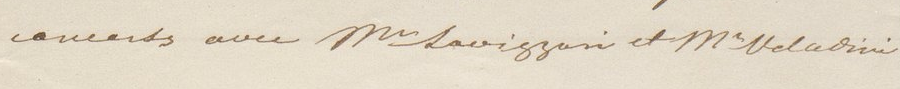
concerts avec MrLavizzari et MrVeladini
